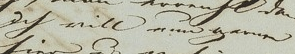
Ich will nun gerne
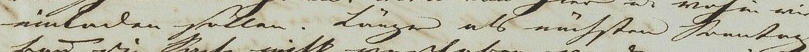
einladen sollen. Länger als nächsten Sonntag
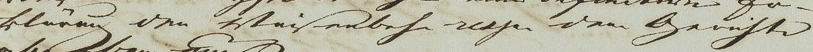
klärung den Waisenbeh. resp. dem Gerichte
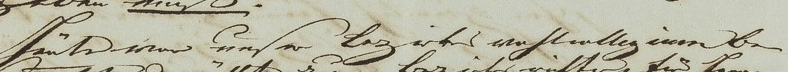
Heute war unser Bezirkswahlcollegium be-
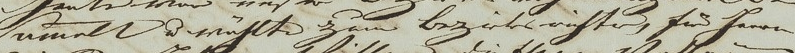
sammelt u. wählte zum Bezirksrichter, für Herrn
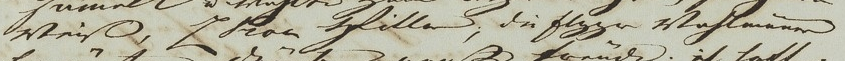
Weiß, Herrn Proc. Spiller; die Elgger Wahlmänner
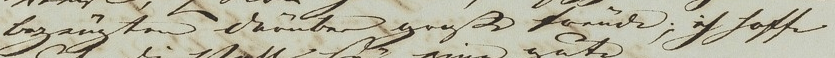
bezeugten darüber große Freude; ich hoffe
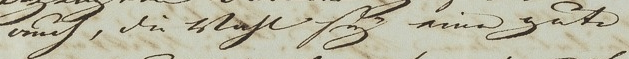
auch, die Wahl sey eine gute.
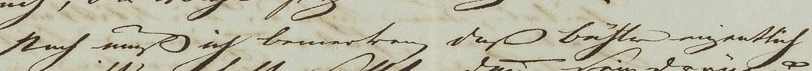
Noch muß ich bemerken, daß Bühler eigentlich
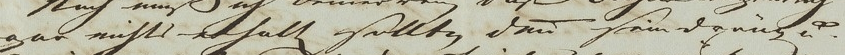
gar nichts erhalten sollte, denn sein Drängen u.
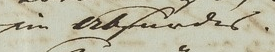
ein Absurdes.
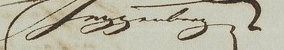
Huggenberger.
